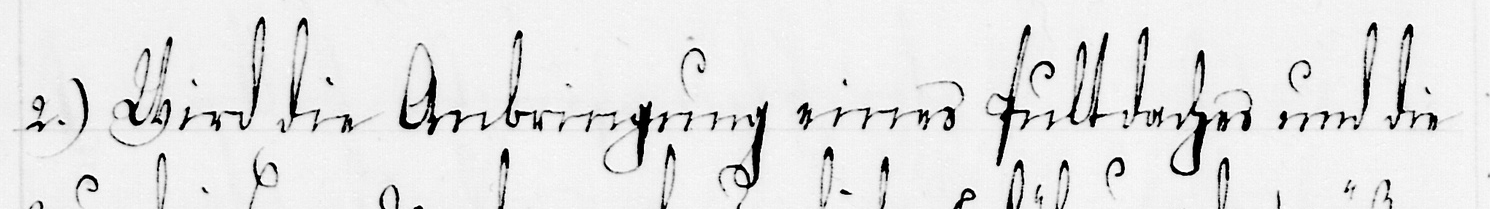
2.) Wird die Anbringung eines Pultdaches und die
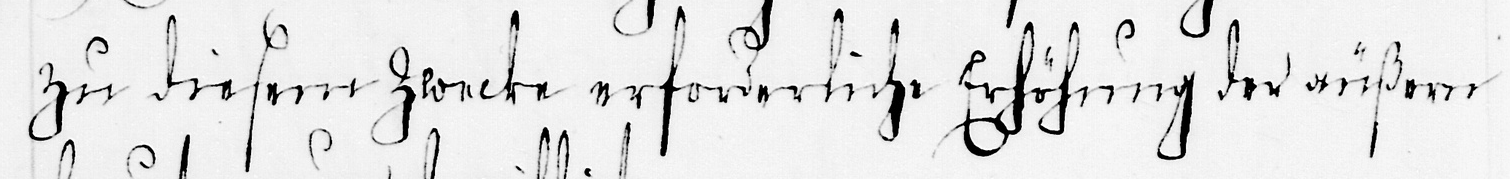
zu diesem Zwecke erforderliche Erhöhung der äußern
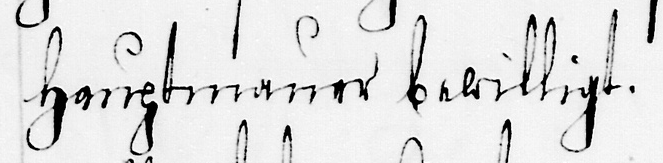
Hauptmauer bewilligt.
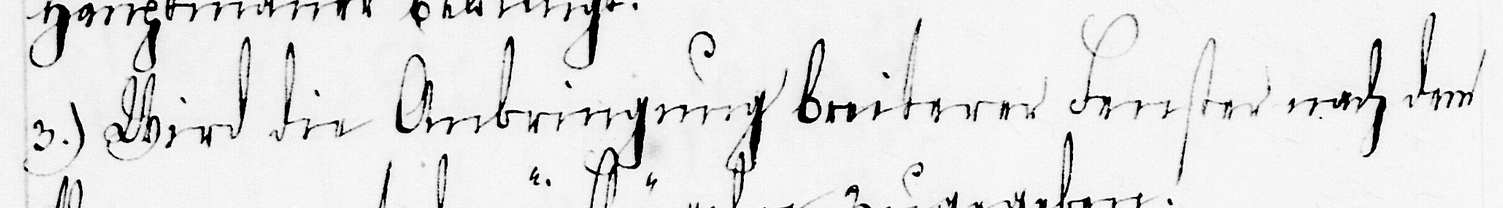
3.) Wird die Anbringung breiterer Fenster nach dem
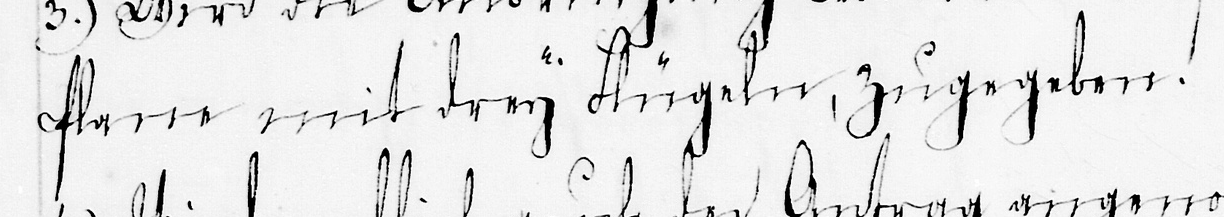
Plane mit drey Flügeln, zugegeben.
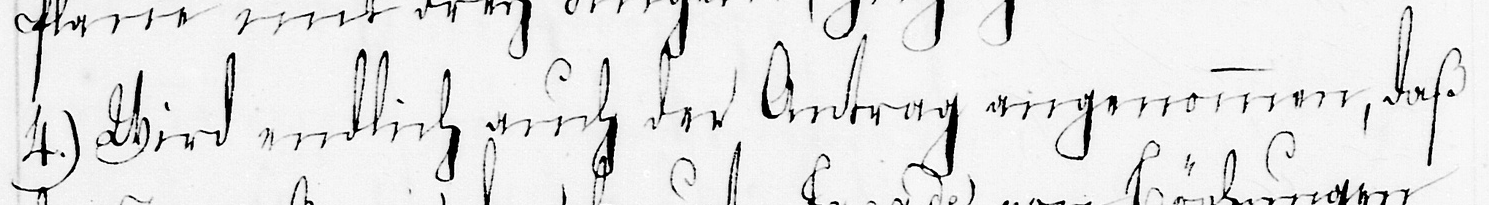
4.) Wird endlich auch der Antrag angenommen, daß
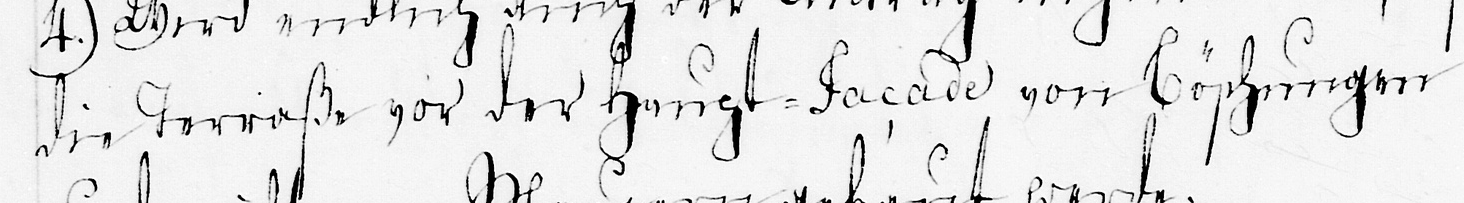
die Terraße vor der Haupt-Facade von Böschungen
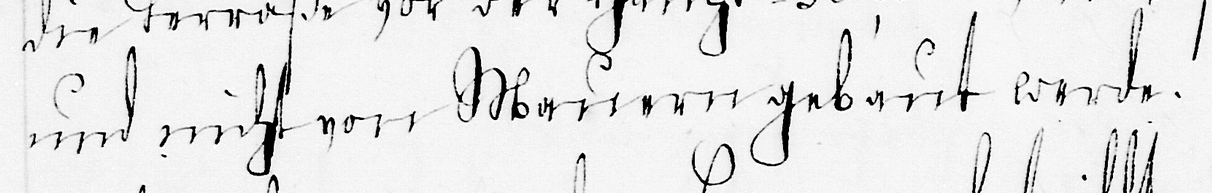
und nicht von Mauern gebaut werde.
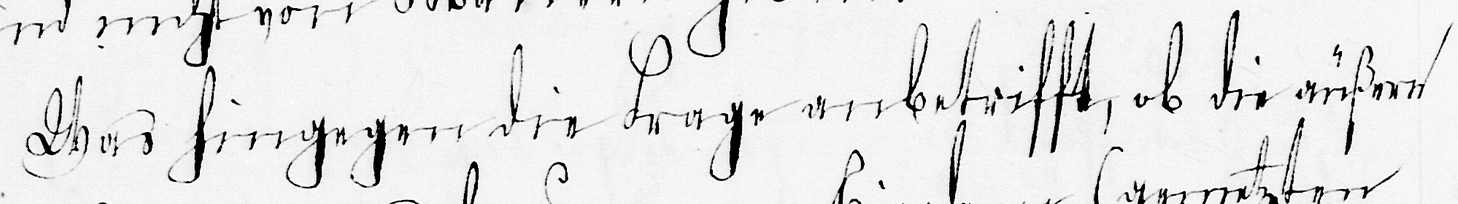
Was hingegen die Frage anbetrifft, ob die äußern
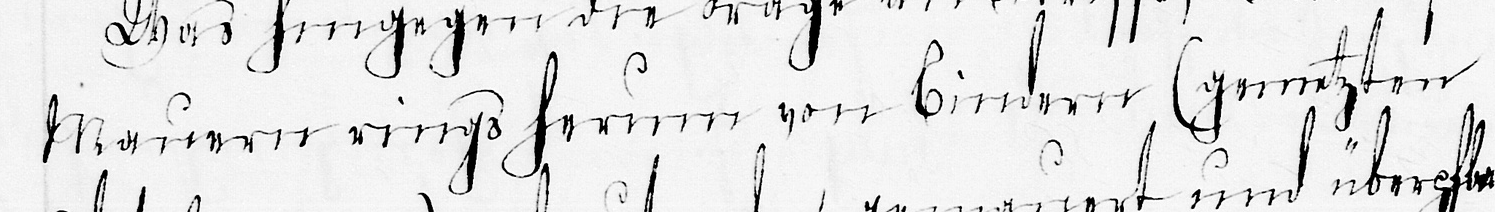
Mauern rings herum von Bindern (gemetzten
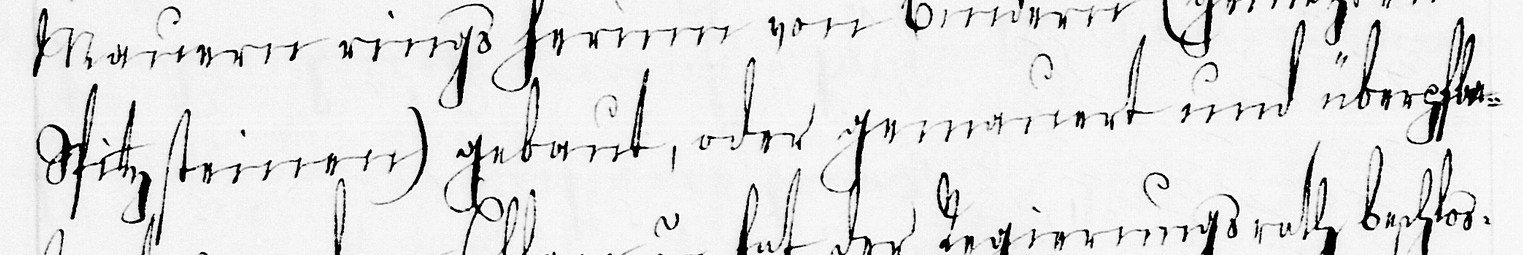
Spitzsteinen) gebaut, oder gemauert und überpfla¬
